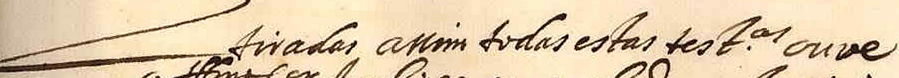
E tiradas assim todas estas test.as ouve
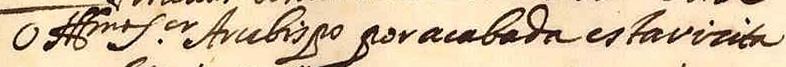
o Ill.mo S.or Arcebispo por acabada esta vizita
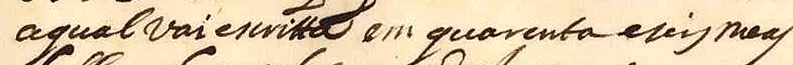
a qual vai escritta em quarenta e seis meas
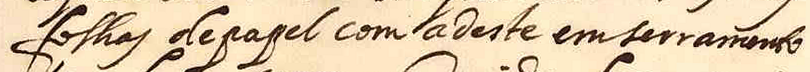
folhas de papel com a deste emserramento
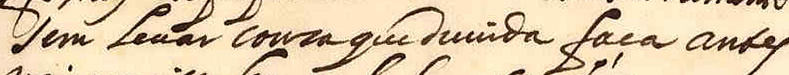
sem leuar couza que duuida faça antes
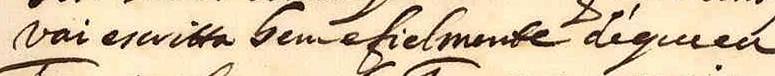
vai escritta bem e fielmente de que eu
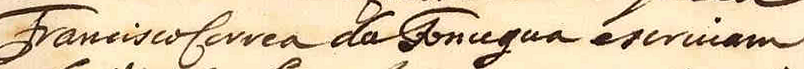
Francisco Correa da Foncequa escriuam
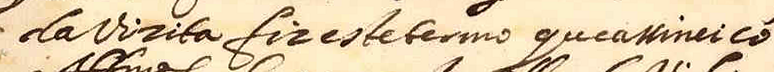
da vizita fiz este termo que assinei cō
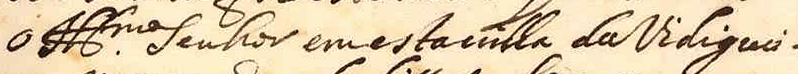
o Ill.mo Senhor em esta uilla da Vidiguei
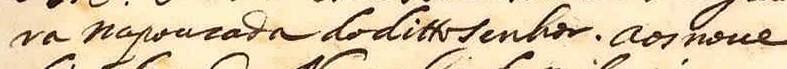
ra na pouzada do ditto senhor. aos noue
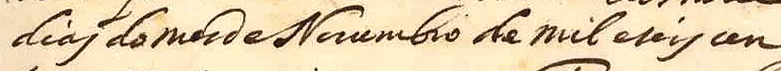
dias do mes de Nouembro de mil e seiscen
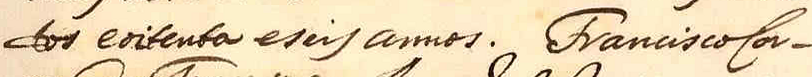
tos e oitenta e seis annos. Francisco Cor
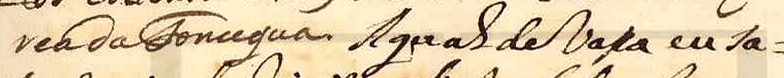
rea da Foncequa A qual deVassa eu sa
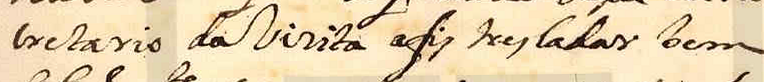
cretario da Vizita a fiz tresladar bem
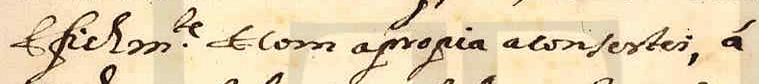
& fielm.te E com a propia a consertei, á
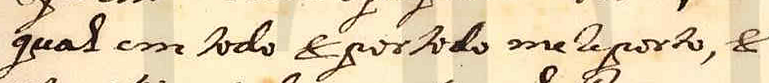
qual em todo & por todo me Reporto, &
